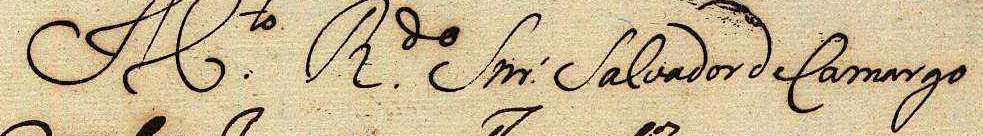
Ill.to R.do Snr̄. Salvador de Camargo
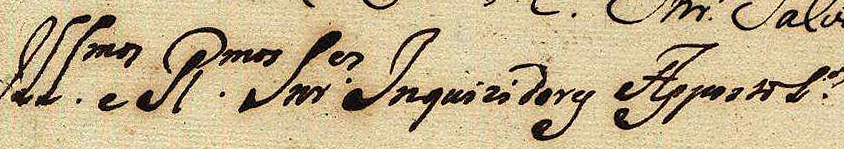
Ill.mos e R.mos Snr̄.es Inquizidores Apposto.os
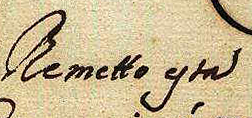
Remetto esta
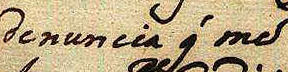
denuncia q̄ me
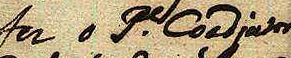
fez o P.e Coadjutor
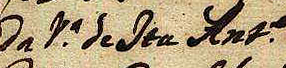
da V.a de Itu Ant.o
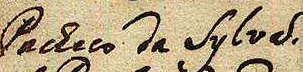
Pacheco da Sylva.
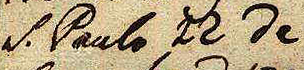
S. Paulo 22 de
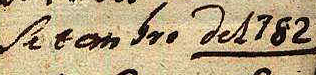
Setembro de 1782
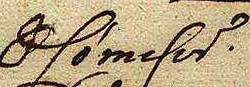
O Comessr.o
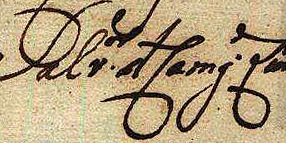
Salv.or de Camj.e Lima
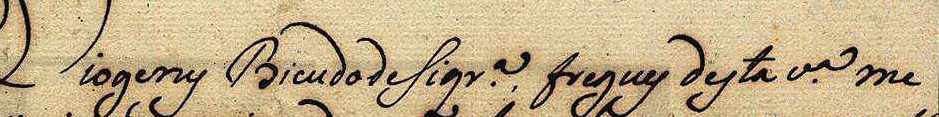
Diogenes Bicudo de Siqr.a, fregues desta v.a me
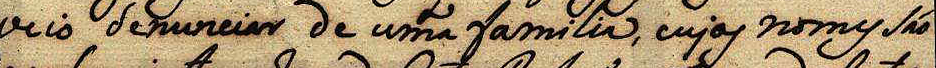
veio denunciar de uma familia, cujos nomes saõ
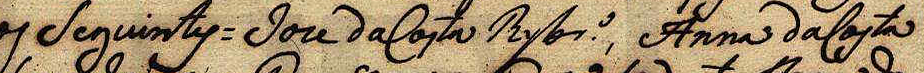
os Seguintes = Ioze da Costa Rybr.o, Anna da Costa
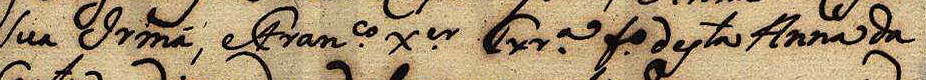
sua Irmã, e Fran.co X.er Txr.a f.o desta Anna da
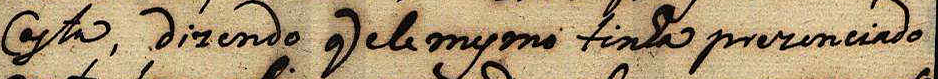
Costa, dizendo q̄ ele mesmo tinha prezenciado
